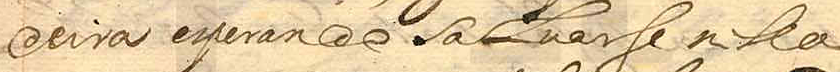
deira esperando saLuarse nella
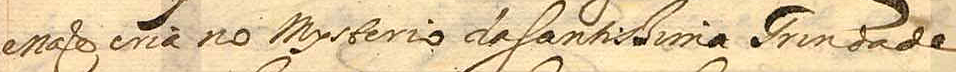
e naõ cria no mysterio da santissima Trindade
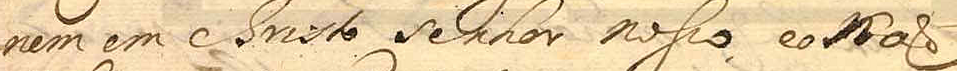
nem em christo senhor nosso e o naõ
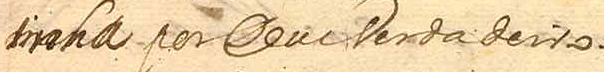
tinha por Deus verdadeiro.
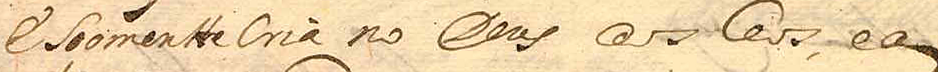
E soomentte cria no Deus dos Ceos, e a
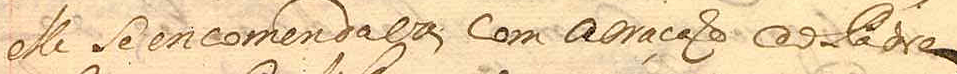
elle se encomendava com a oração do Padre
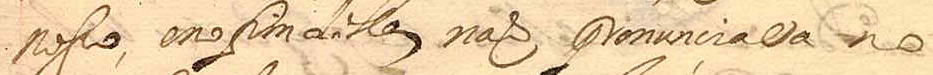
nosso, e no fim della naõ pronunçiava no
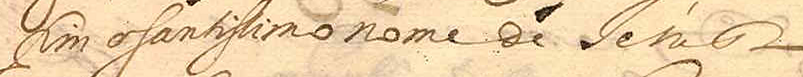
fim o santissimo nome de Jesus
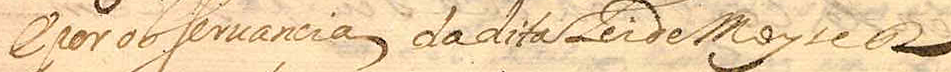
E por obseruançia da dita Lei de Moyses
